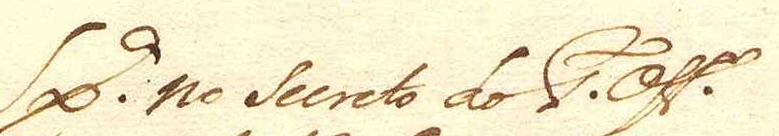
Lx.a no Secreto do s.to Off.o
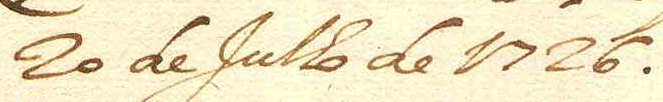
20 de Julho de 1726.
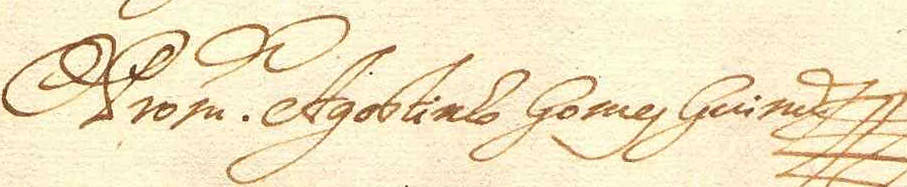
O Prom.or Agostinho Gomes Guimes
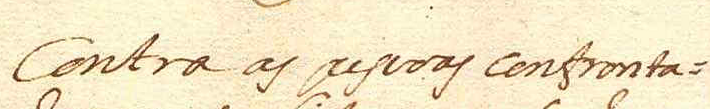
Contra as pessoas confronta
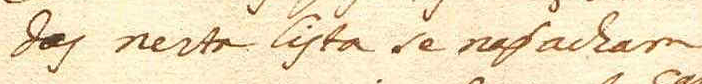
das nesta lista se naõ acham
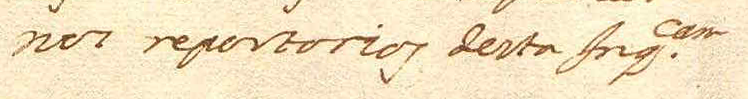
nos repertorios desta Jnq.çam
